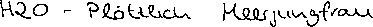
H2O – Plötzlich Meerjungfrau
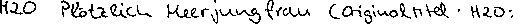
H2O Plötzlich Meerjungfrau (Originaltitel: H2O:
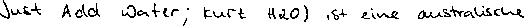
Just Add Water; kurz: H2O) ist eine australische
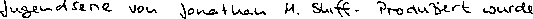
Jugendserie von Jonathan M. Shiff. Produziert wurde
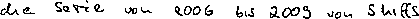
die Serie von 2006 bis 2009 von Shiffs
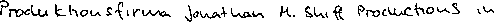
Produktionsfirma Jonathan M. Shiff Productions in
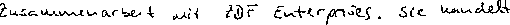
Zusammenarbeit mit ZDF Enterprises. Sie handelt
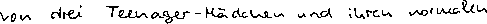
von drei Teenager-Mädchen und ihren normalen
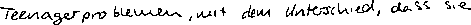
Teenagerproblemen, mit dem Unterschied, dass sie
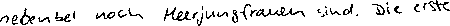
nebenbei noch Meerjungfrauen sind. Die erste
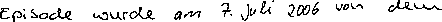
Episode wurde am 7. Juli 2006 von dem
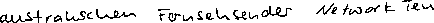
australischen Fernsehsender Network Ten
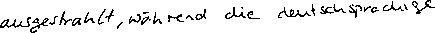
ausgestrahlt, während die deutschsprachige
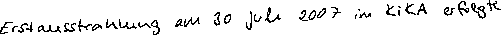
Erstausstrahlung am 30. Juli 2007 im KiKA erfolgte.
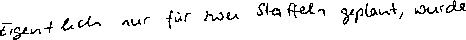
Eigentlich nur für zwei Staffeln geplant, wurde
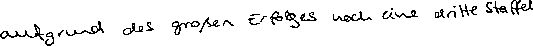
aufgrund des großen Erfolges noch eine dritte Staffel
